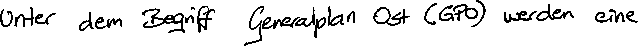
Unter dem Begriff Generalplan Ost (GPO) werden eine
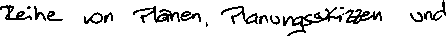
Reihe von Plänen, Planungsskizzen und
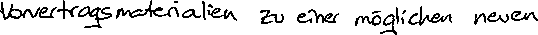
Vortragsmaterialien zu einer möglichen neuen
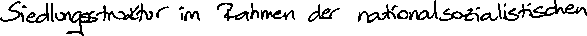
Siedlungsstruktur im Rahmen der nationalsozialistischen
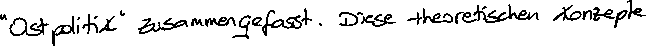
"Ostpolitik" zusammengefasst. Diese theoretischen Konzepte
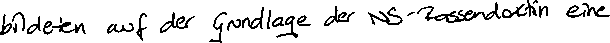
bildeten auf der Grundlage der NS-Rassendoktrin eine
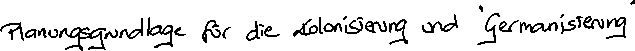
Planungsgrundlage für eine Kolonisierung und "Germanisierung"
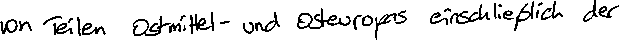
von Teilen Ostmittel- und Osteuropas einschließlich der
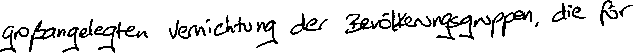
roßangelegten Vernichtung der Bevölkerungsgruppen, die für
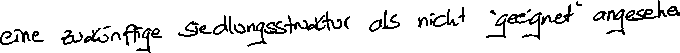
eine zukünftige Siedlungsstruktur als nicht "geeignet" angesehen
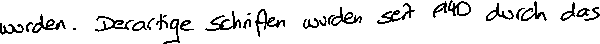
wurden. Derartige Schriften wurden seit Frühjahr 1940 durch das
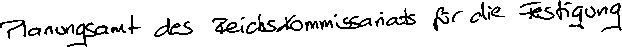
Planungsamt des Reichskommissariats für die Festigung
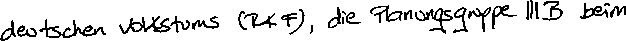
deutschen Volkstums (RKF), die Planungsgruppe lll B beim
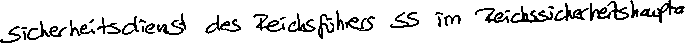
Sicherheitsdienst des Reichsführers SS im Reichssicherheitshauptamt
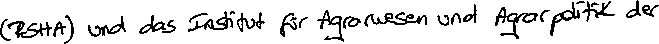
(RSHA) und das Institut für Agrarwesen und Agrarpolitik der
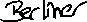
Berliner
